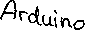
Arduino
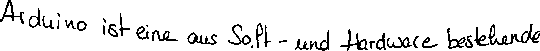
Arduino ist eine aus Soft- und Hardware bestehende
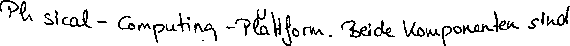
Physical-Computing-Plattform. Beide Komponenten sind
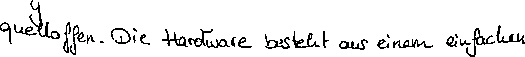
quelloffen. Die Hardware besteht aus einem einfachen
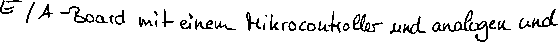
E/A-Board mit einem Mikrocontroller und analogen und
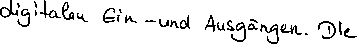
digitalen Ein- und Ausgängen. Die
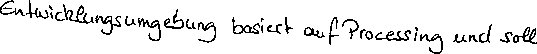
Entwicklungsumgebung basiert auf Processing und soll
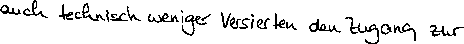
auch technisch weniger Versierten den Zugang zur
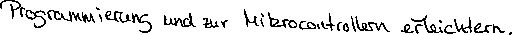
Programmierung und zu Mikrocontrollern erleichtern.
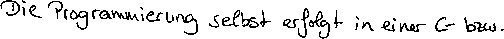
Die Programmierung selbst erfolgt in einer C- bzw.
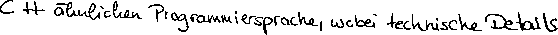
C++-ähnlichen Programmiersprache, wobei technische Details
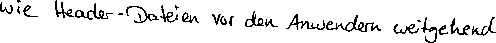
wie Header-Dateien vor den Anwendern weitgehend
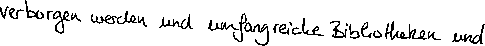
verborgen werden und umfangreiche Bibliotheken und
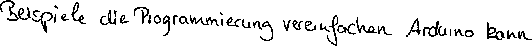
Beispiele die Programmierung vereinfachen. Arduino kann
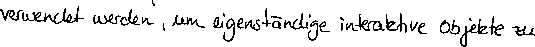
verwendet werden, um eigenständige interaktive Objekte zu
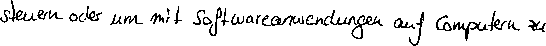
steuern oder um mit Softwareanwendungen auf Computern zu
